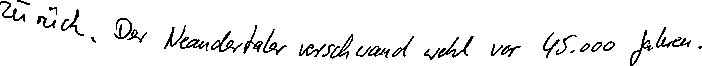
zurück. Der Neandertaler verschwand wohl vor 45.000 Jahren.
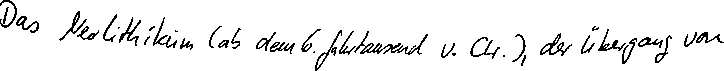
Das Neolithikum (ab dem 6. Jahrtausend v. Chr.), der Übergang von
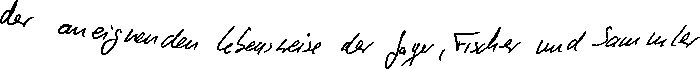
der aneignenden Lebensweise der Jäger, Fischer und Sammler
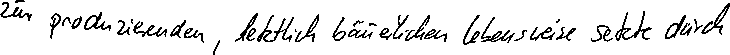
zur produzierenden, letztlich bäuerlichen Lebensweise setzte durch
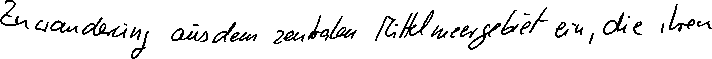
Zuwanderung aus dem zentralen Mittelmeergebiet ein, die ihren
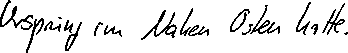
Ursprung im Nahen Osten hatte.
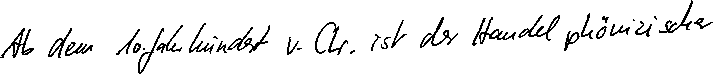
Ab dem 10. Jahrhundert v. Chr. ist der Handel phönizischer
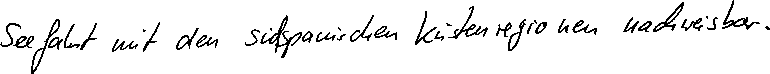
Seefahrer mit den südspanischen Küstenregionen nachweisbar.
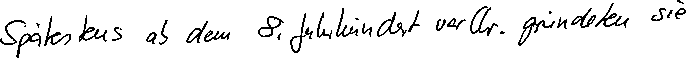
Spätestens ab dem 8. Jahrhundert v. Chr. gründeten sie
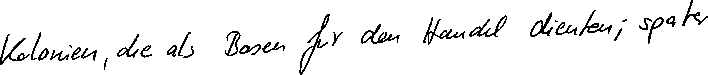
Kolonien, die als Basen für den Handel dienten; später
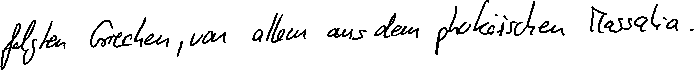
folgten Griechen, vor allem aus dem phokäischen Massalia.
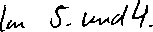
Im 5. und 4.
